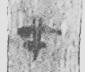七十
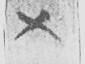五
